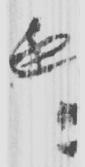臣=
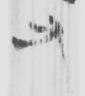又
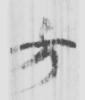方
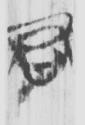君
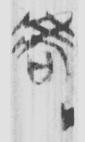唬
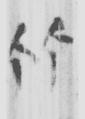比
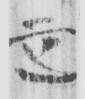正
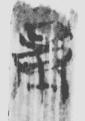量
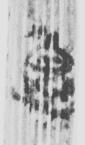惪
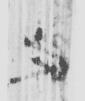之
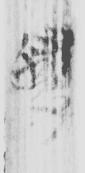{臣又力}
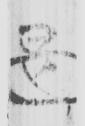是
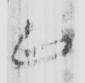㠯（以）
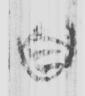自
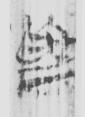爲
